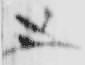之
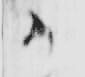人
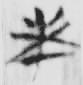未
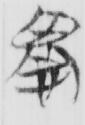愄（威）
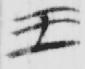王
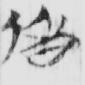俈
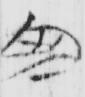室
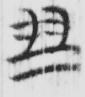翏
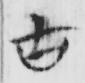古
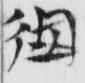○（卜）
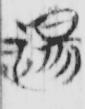湯
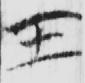壬
